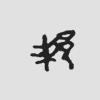邦
